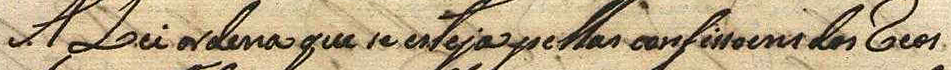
A Lei ordena que se esteja pellas confissoens dos Reos
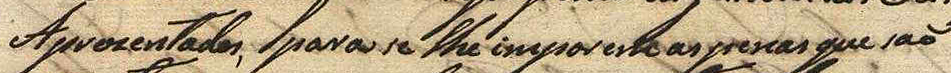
Apresentados, para se lhe imporem as penas que saõ
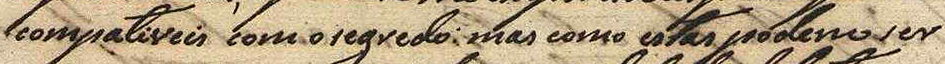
compativeis com o segredo: mas como estas podem ser
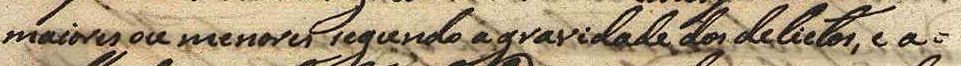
maiores ou menores segundo a gravidade dos delictos, e a
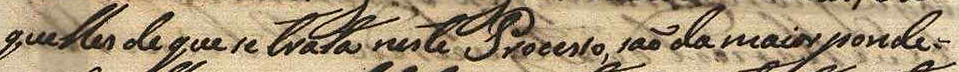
que lhes de que se trata neste Processo, saõ da maior ponde
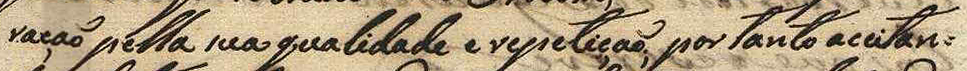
raçaõ pella sua qualidade e repetiçaõ; portanto aceitan
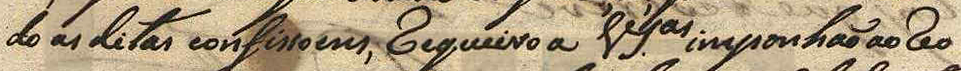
do as ditas confissoens, Requeiro a V.S.as imponhaõ ao Reo
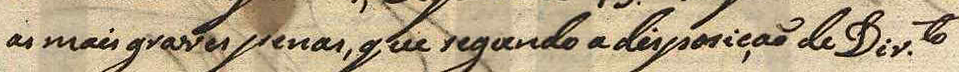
as mais graves penas, que segundo a disposiçaõ de Dir.to
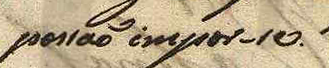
possaõ impor-se.
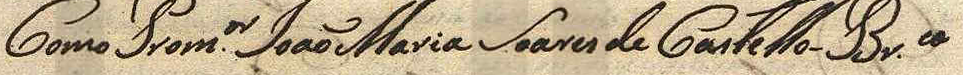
Como Prom.or Ioaõ Maria Soares de Castello-Br.co
